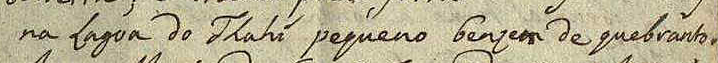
na Lagoa do Thahí pequeno benzem de quebranto.
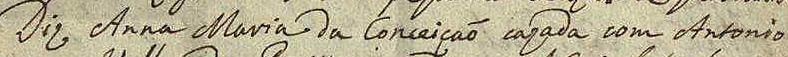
Diz Anna Maria da Conceiçaõ cazada com Antonio
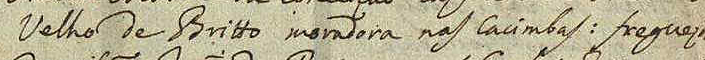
Velho de Britto, moradora nas Cacimbas: freguezia
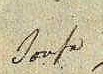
Iosefa
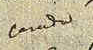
casada
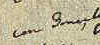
com Gonçalo
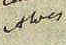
Alves
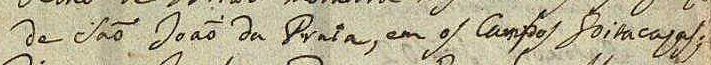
de Saõ Joaõ da Prata, em os Campos Goitacazas;
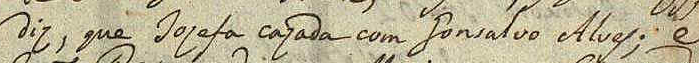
diz, que Iozefa cazada com Gonsalvo Alves; e
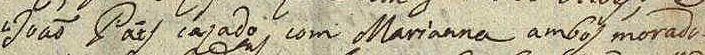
Joaõ Pais cazado com Marianna ambos morado
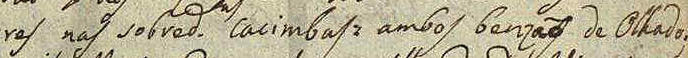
res nas sobred.tas Cacimbas: ambos benzaõ de Olhado,
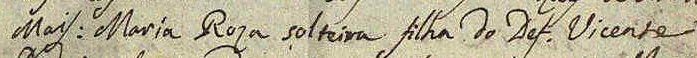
Mais: Maria Roza solteira filha do Def. Vicente
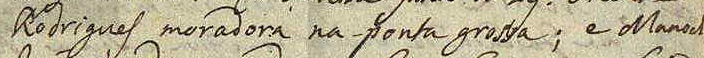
Rodrigues moradora na ponta grossa; e Manoel
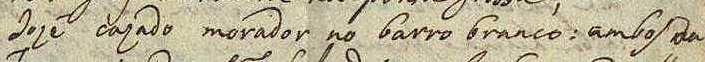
Iozé cazado morador no barro branco: ambos da
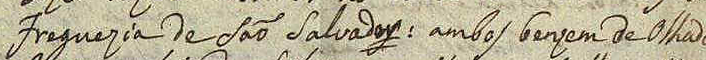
Freguezia de Saõ Salvador: ambos benzem de Olhado
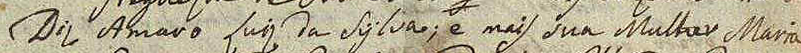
Diz Amaro Luiz da Sylva; e mais sua Mulher Maria
